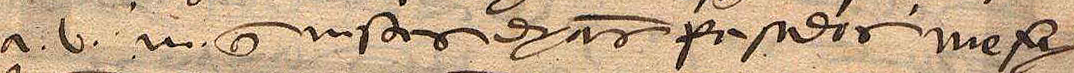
a. v. m. q̄ nestes dyas pasados me foy
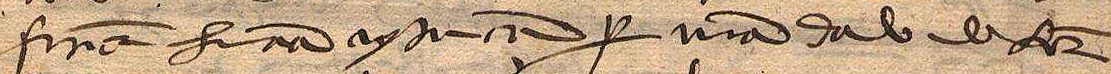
fct̄a huaā cytaçā ꝑ mādado do sōr
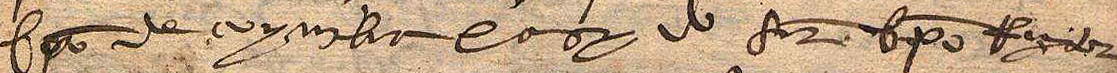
bp̄o de coymbra e asy do sōr bp̄o Reytor
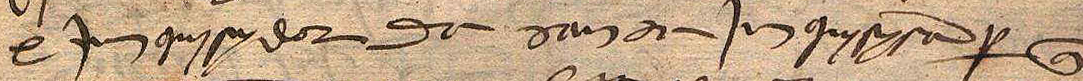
e Jmqujsydor da santa Jmquysysā ꝑ q̄
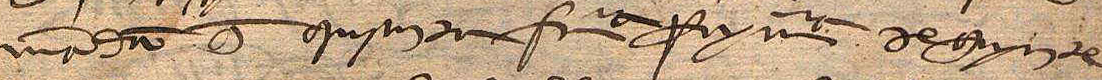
mādão q̄ qujmta frra prymra seguynte
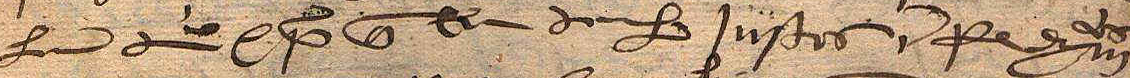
hū to e p̄oq̄ Eu tenho Justos ēpedymtos
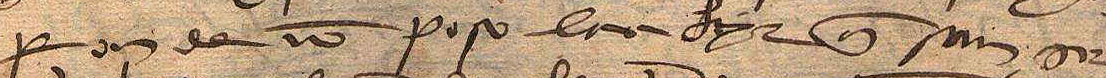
ꝑ omde n̄o poso laa hyr q̄ sam ser
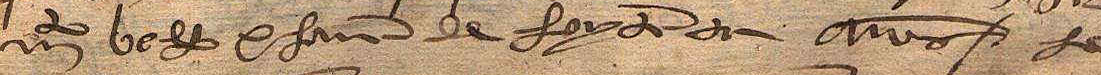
mto velho e homē de hoytēta an̄os / he
